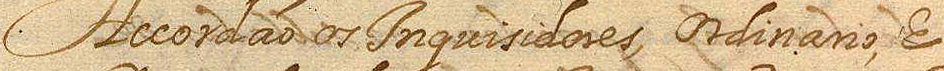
Accordaõ os Inquisidores, Ordinario, E
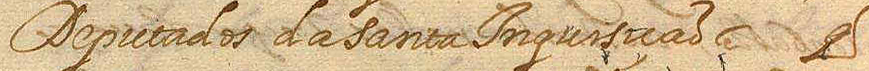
Deputados da Santa Inquisiçaõ q̄
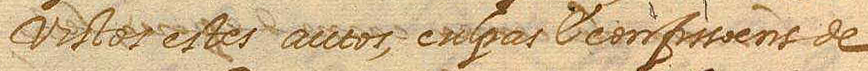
vistos estes autos, culpas E confissoens de
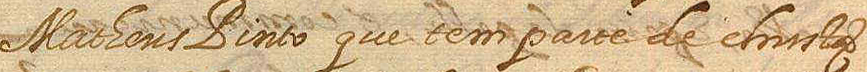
Matheus Pinto que tem parte de christaõ
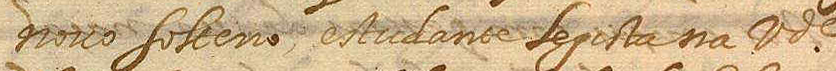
nouo solteiro, estudante Legista na Vde.
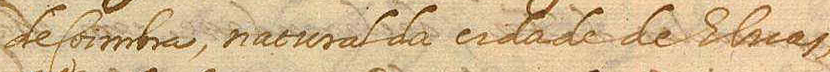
de Coimbra, natural da cidade de Eluas,
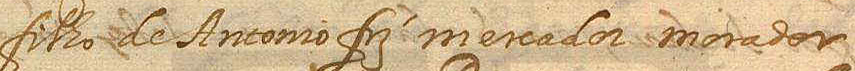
filho de Antonio frz̄ mercador morador
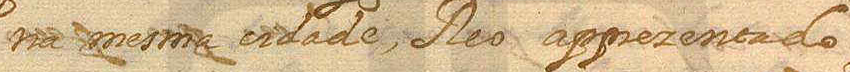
na mesma cidade, Reo apprezentado
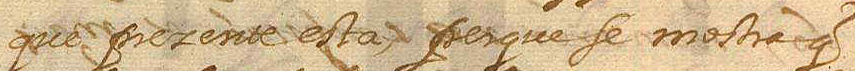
que prezente esta, per que se mostra q̄
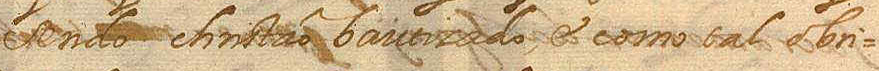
sendo christaõ bautizado, & como tal obri
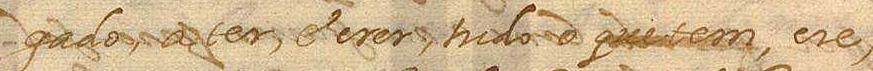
gado, a ter, & crer, tudo o que tem, cre
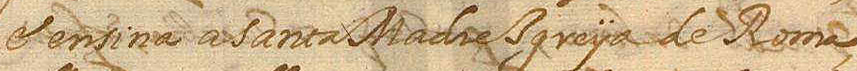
& ensina a santa Madre Igreya de Roma,
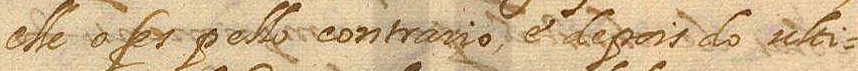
elle o fes pello contrario, e depois do ulti
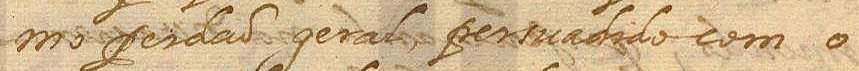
mo perdaõ geral, persuadido com o
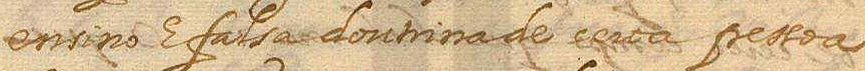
ensino E falsa doutrina de certa pessoa
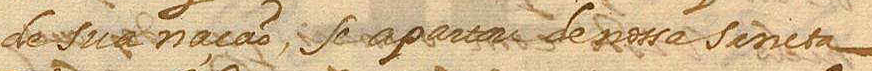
de sua naçaõ, se apartou de nossa sancta
